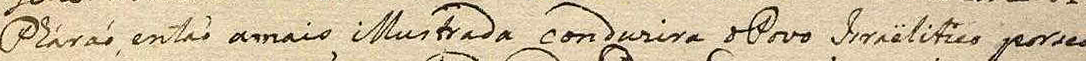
Pháraó, entaõ a mais illustrada conduzira o Povo Israelitico por seo
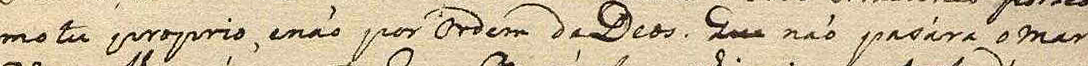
motu proprio, e naõ por ordem de Deos. Que naõ pasára o mar
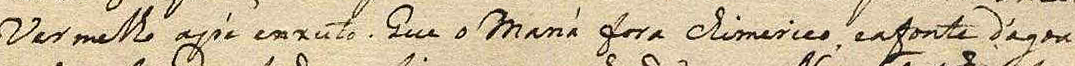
Vermelho a pé enxuto. Que o Mana fora chimerico, e a fonte d'agoa
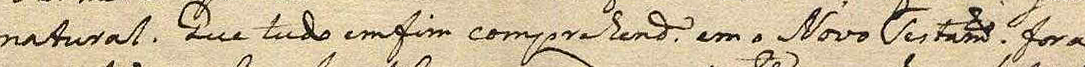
natural. Que tudo emfim comprehend.o em o Novo Testam.to fora
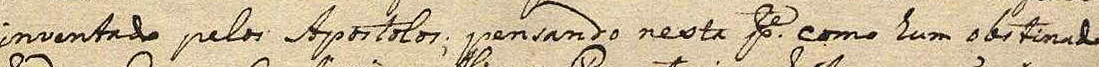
inventado pelos Apostolos; pensando nesta p.te como hum obstinado
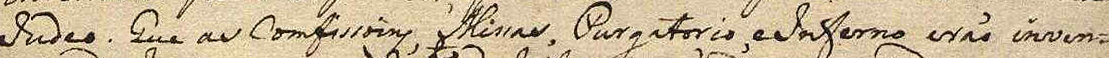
Iudeo. Que as Comfissoins, Missas, Purgatorio, e Inferno eraõ inven
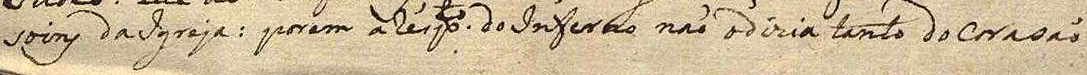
soins da Igreja: porem a Resp.to do Inferno naõ o dizia tanto do corasaõ
